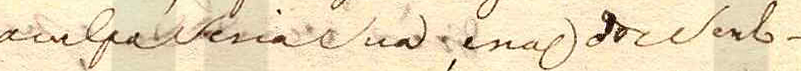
a culpa Seria Sua, e naõ dos Senho
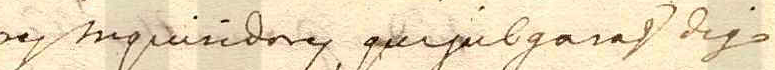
res Inquisidores, que julgaraõ digo
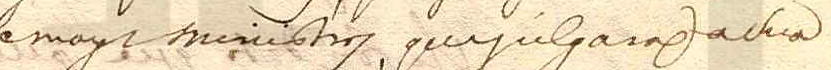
e mays ministros, que julgaraõ a Sua
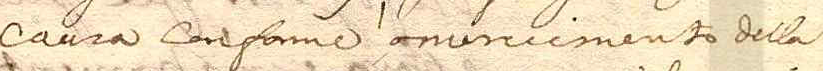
cauza conforme o merecimento della
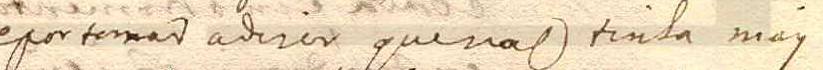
e por tornar a dizer que naõ tinha mais
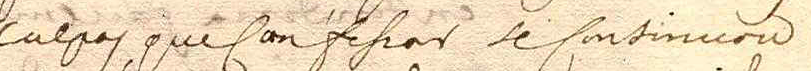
culpas, que Confessar se Continuou
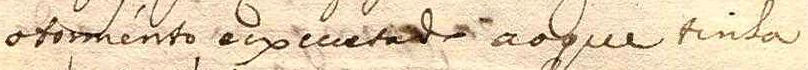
o tormento, e executado ao que tinha
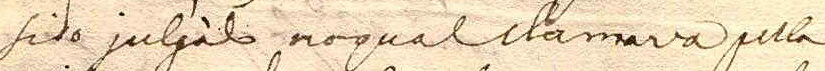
sido julgàdo no qual chamava pella
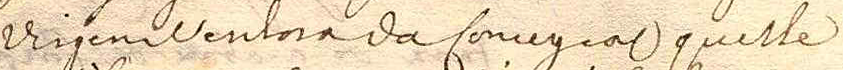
Virgem Senhora da Conceyçaõ que lhe
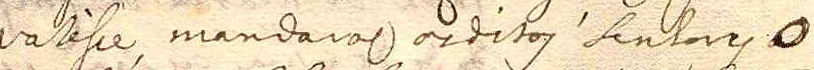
valésse, mandaraõ os ditos Senhores O
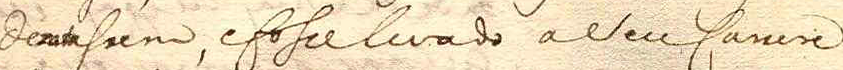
dezatassem, e fosse levado a Seu Carcere
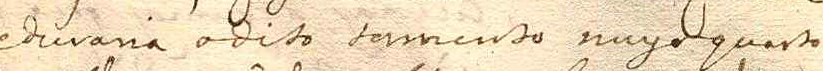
e duraria o dito tormento meyo quarto
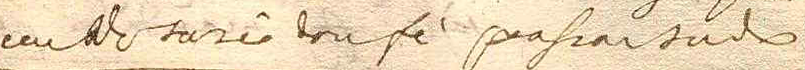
e eu Notario dou fé passar tudo
